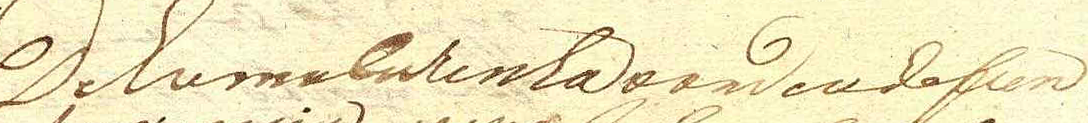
De huma Cazinha aonde a defun
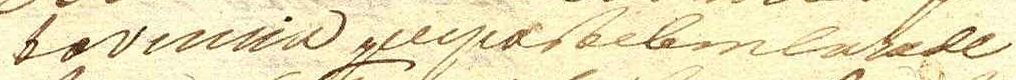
ta veuuia que parte Com Caza de
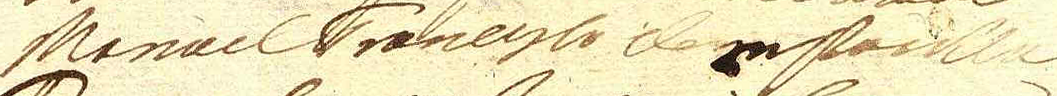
Manoel Francisco e Com Paulla
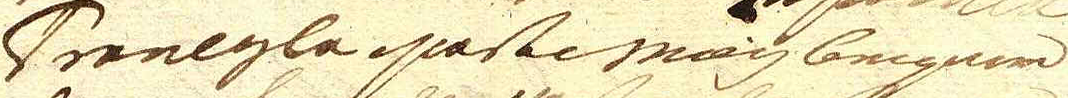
Francisca e parte mais Com quem
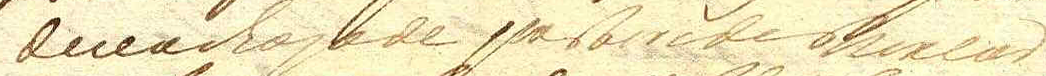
deua e haja de partir e deMarcar
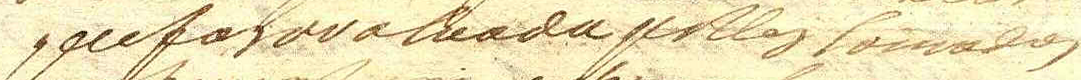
que foj avaluada pellos louuados
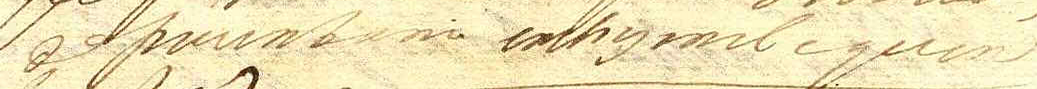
do Jnuentario em tres mil e quin
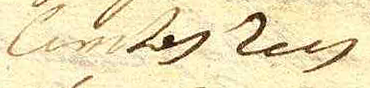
hemtos Reis
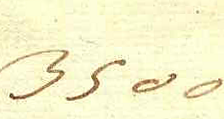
3500
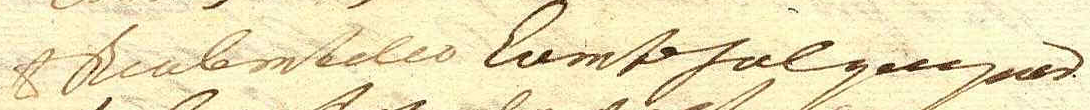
item lhe aComteceo hum tojal que par
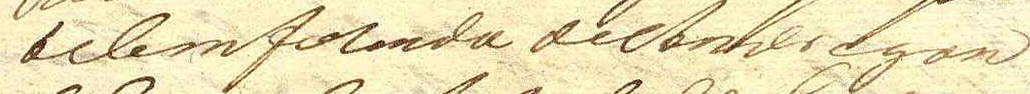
te Com fazenda de Andre gon
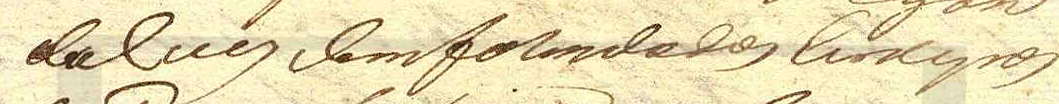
Calues, Com fazenda dos herdejros
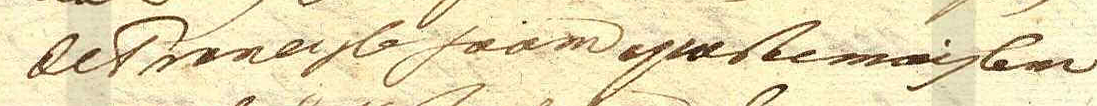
de FrancisCo Joam e parte mais Com
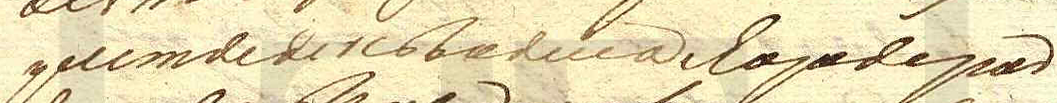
quem de dereito deua e haja de par
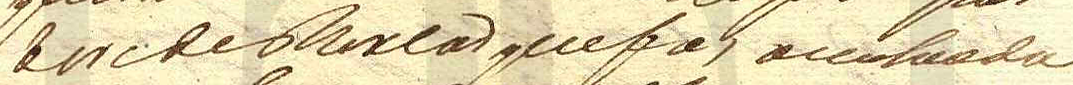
tir e deMarcar que foi aualuada
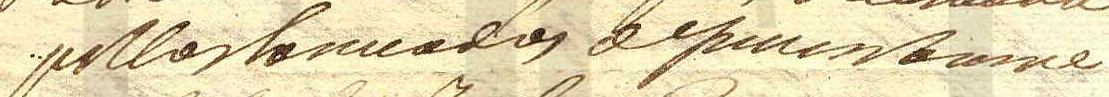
pellos louuados do Jnuentario
